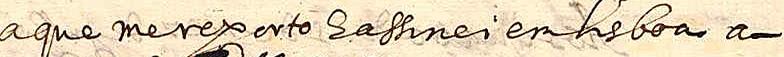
a que me reporto E assinei em lisboa a
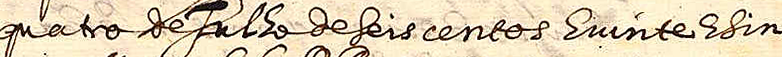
quatro de Julho de seiscentos E uinte E sin
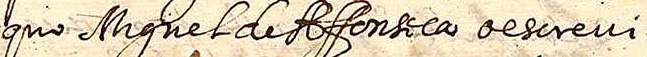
quo Miguel de Affonseca o escreui
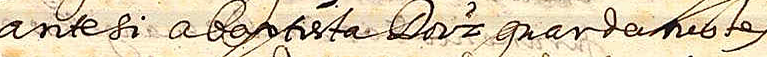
ante si a baptista Roiz̄ guarda nestes
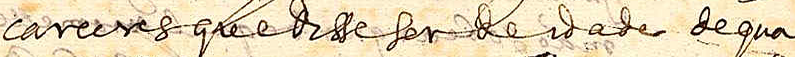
carceres que disse ser de idade de qua
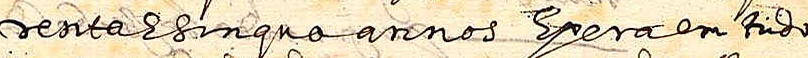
renta E sinquo annos E pera em tudo
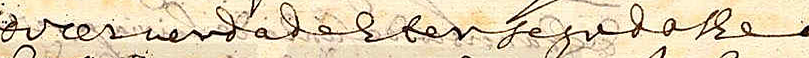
dizer uerdade E ter segredo lhe
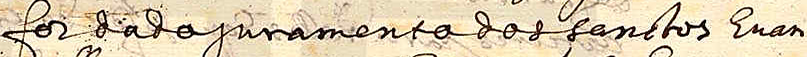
foi dado juramento dos sanctos Euan
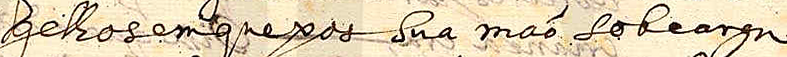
gelhos em que pos sua maõ sob carguo
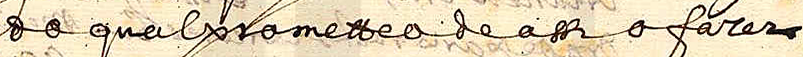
do qual prometteo de assi o fazer
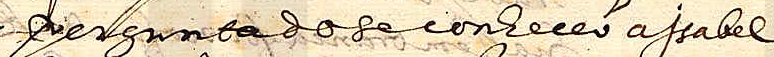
perguntado se conheceo a Jsabel
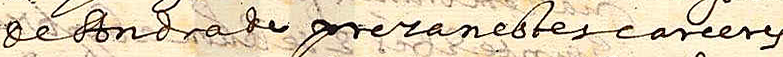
de Andrade preza nestes carceres
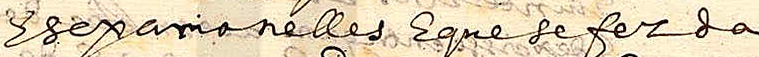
E se pario nelles E que se fez da
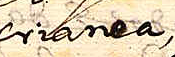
crianca,
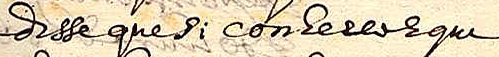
disse que si conheceo E que
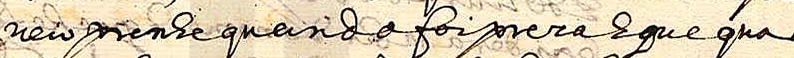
ueio prenhe quando foi preza E que qua
